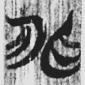非
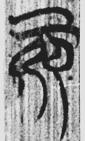而（爾）
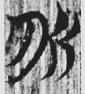所
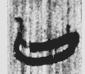㠯（以）
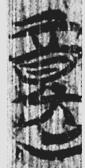○（復）
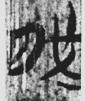我
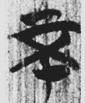不
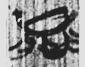能
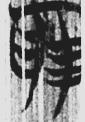○（貫）
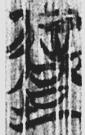壁
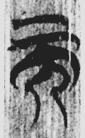而
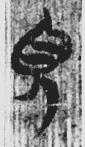○（視）
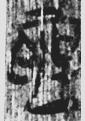聖（聽）
